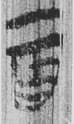百
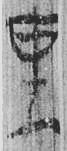里
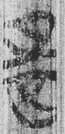是
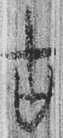古（故）
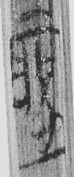聖
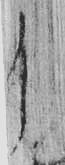人
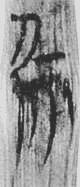○〈凥〉
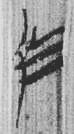於
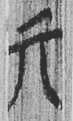亓（其）
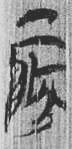所
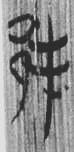邦
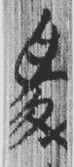○（家）
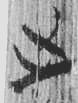之
